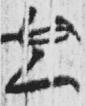也
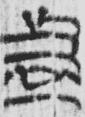者
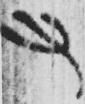又（有）
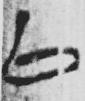㠯（以）
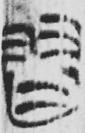習
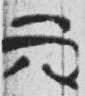亓（其）
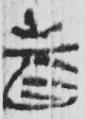眚（性）
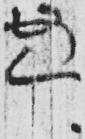也
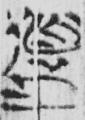道
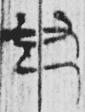也
